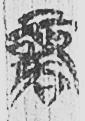商
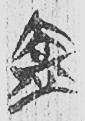盍
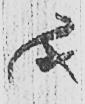氏
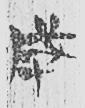成
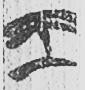王
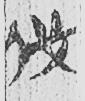伐
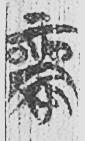商
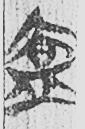盍
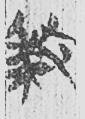殺
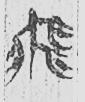飛
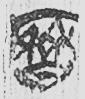{厤甘}
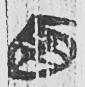西
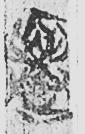{䙴止}
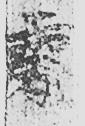商
